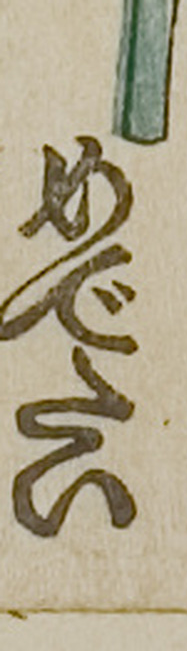めでたい
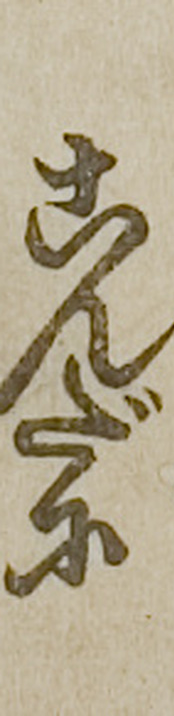こんだに
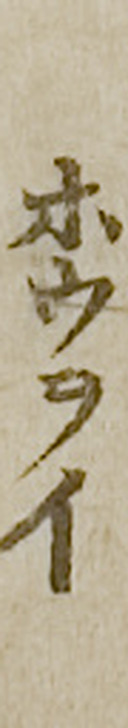ホウヲイ
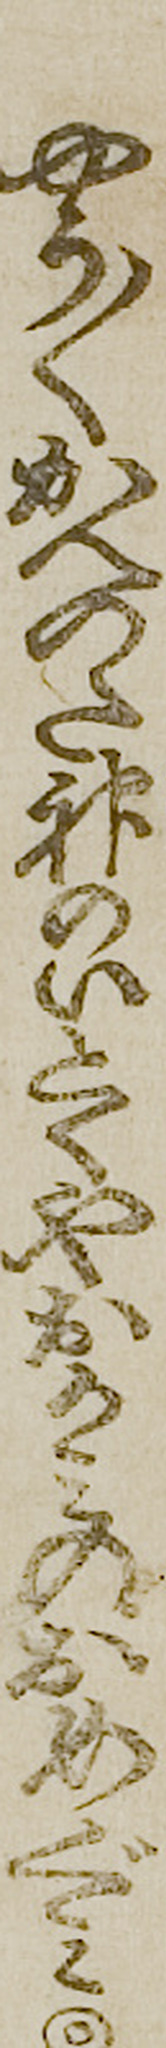やう〳〵かへつた神のいとくやおかみのおめぐみ◎
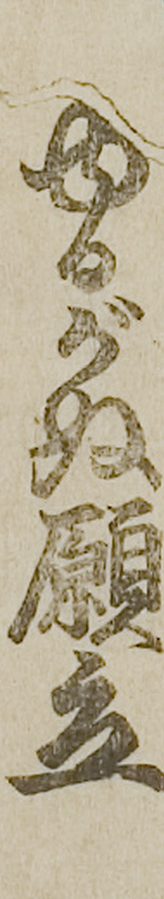ゆるがぬ願立
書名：ちょぼくれちょんがれ
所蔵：東京大学総合図書館 General Library in the University of Tokyo, JAPAN
